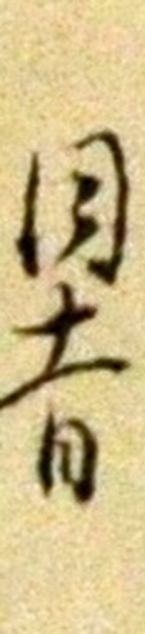同十一日
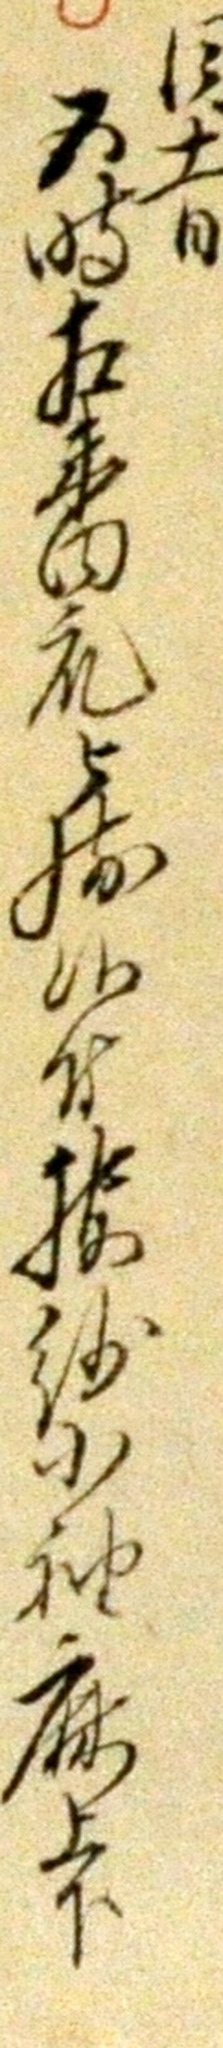五時相番衆被揃候付服紗小袖麻上下
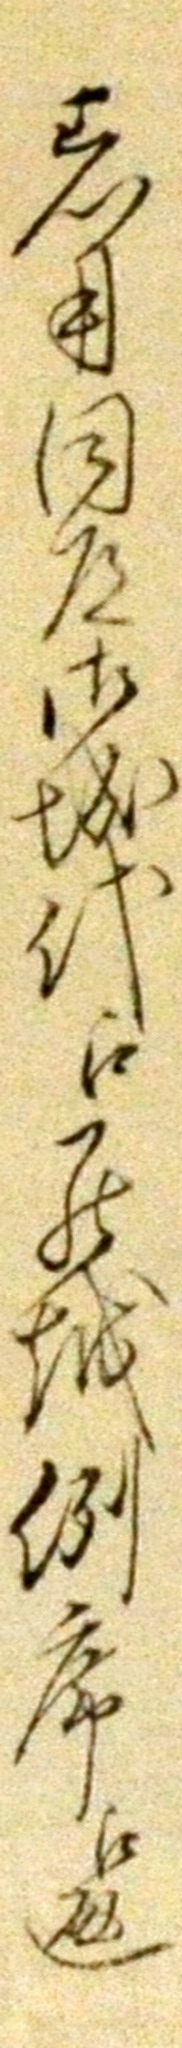着用同道御城代え罷越例席え通
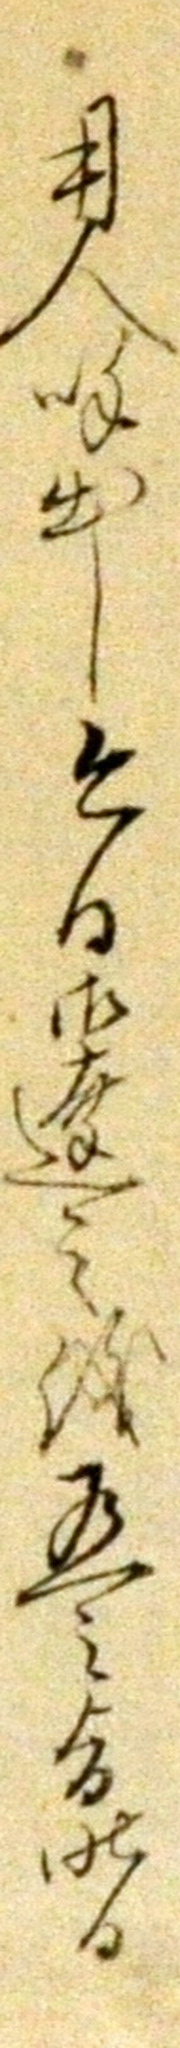用人呼出し今日御達之儀有之旨昨日
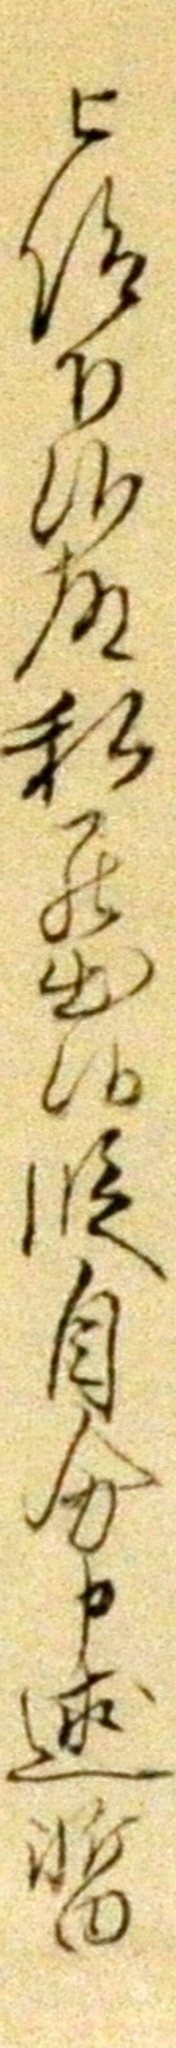被仰下候故私罷出候段自分申述暫
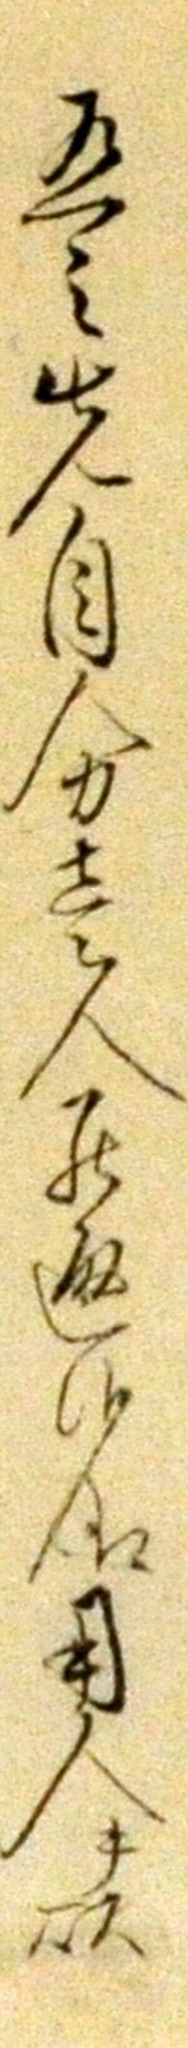有之先自分壱人罷通候様用人ヲ以
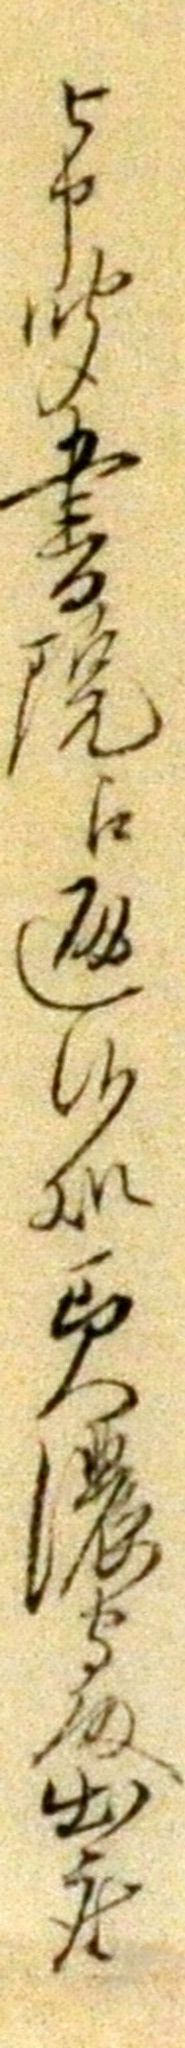被申聞書院え通候処美濃守殿出座
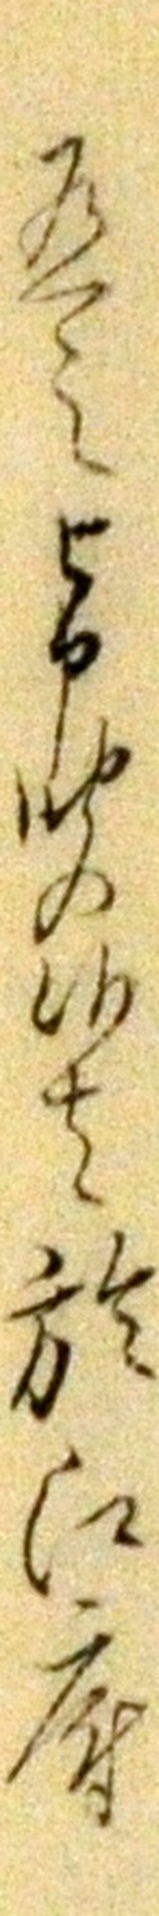有之被申聞候は於江府
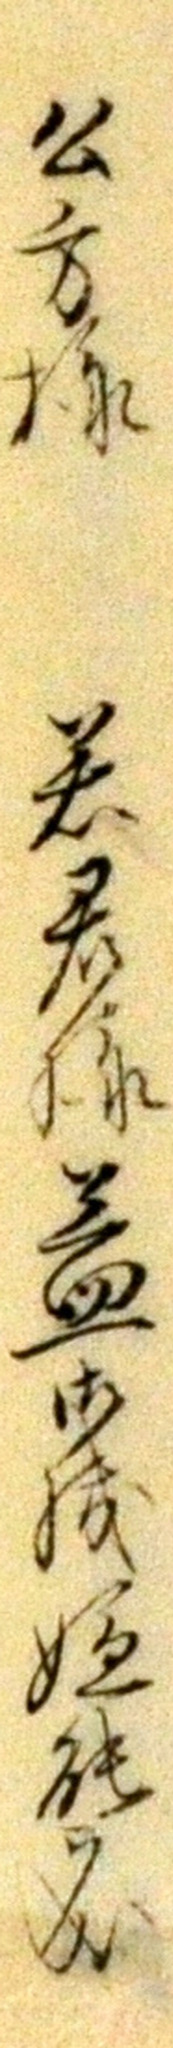公方様若君様益御機嫌能被成
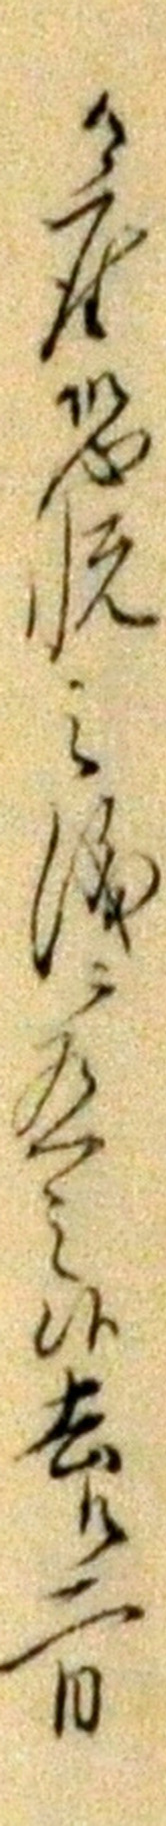御座恐悦之儀ニ有之候去ル二日
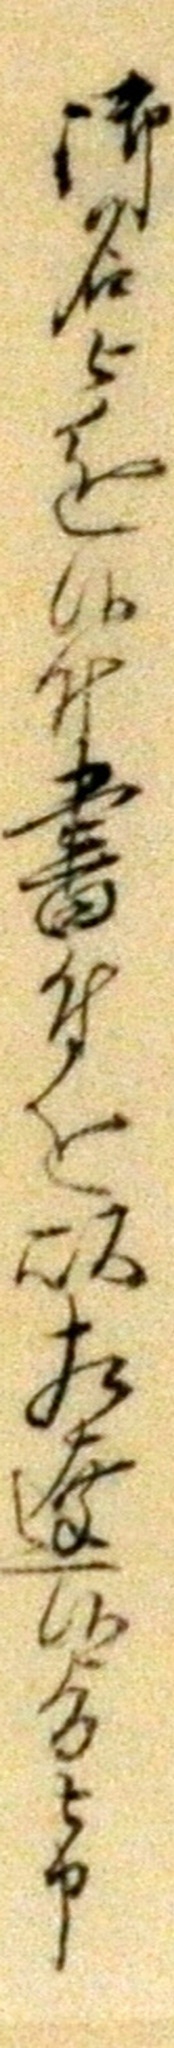御名被進候付書付を以相達候旨被申
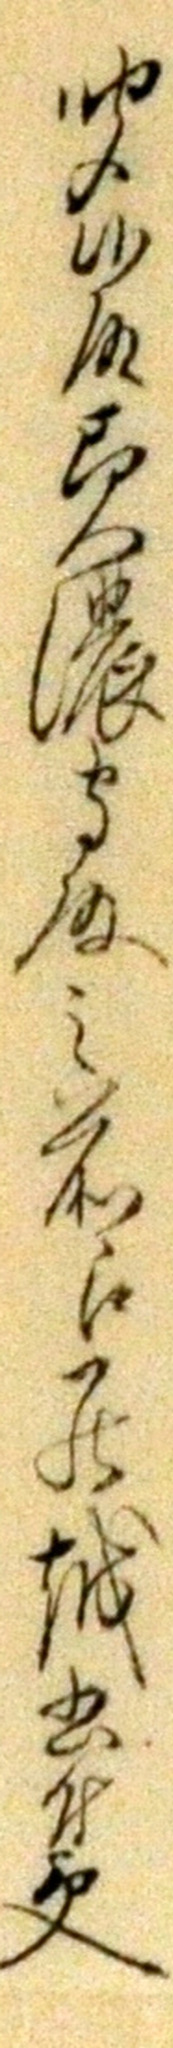聞候故美濃守殿之前え罷越書付受
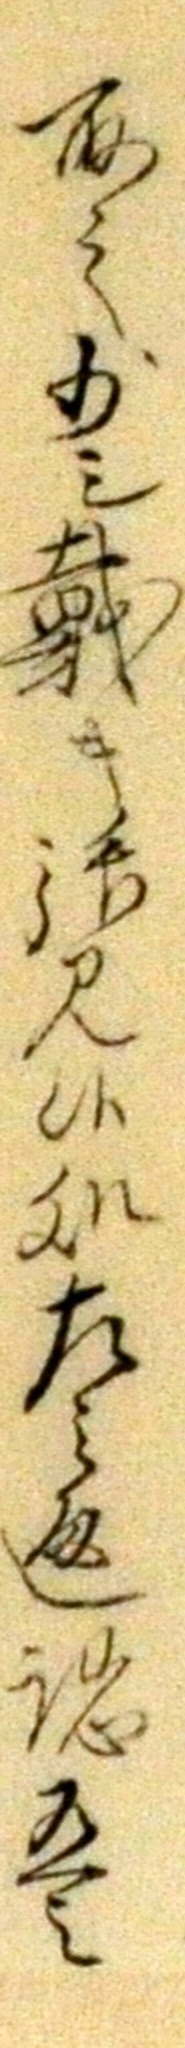取之少シ戴キ拝見候処左之通認有之
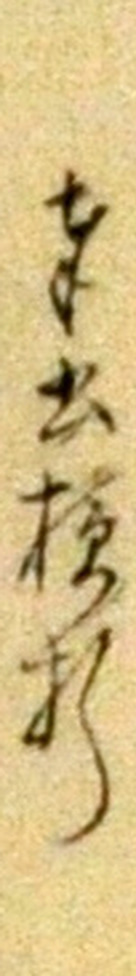奉書横折
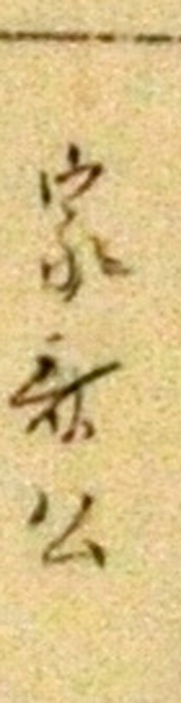家斉公
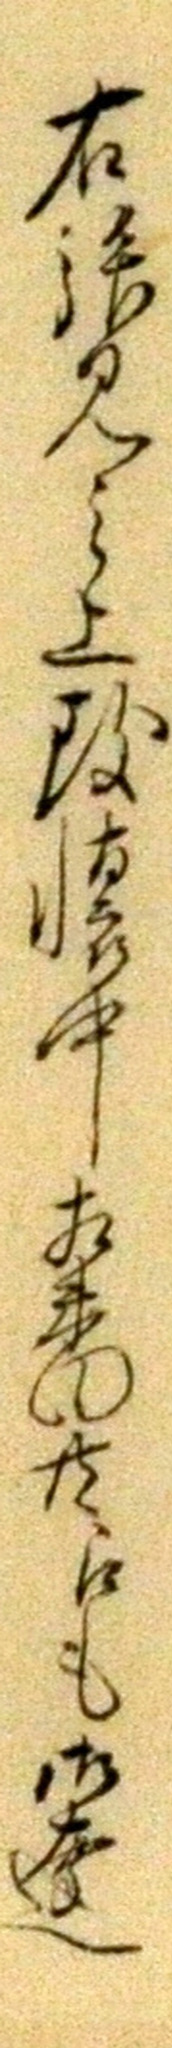右拝見之上致懐中相番共えも御達
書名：大阪加番関係諸書留〔一括〕
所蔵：伊那市立高遠町図書館・合同会社AMANE
